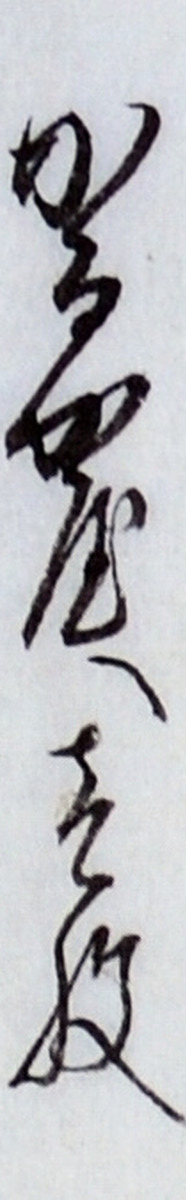かるか屋へ壱枚
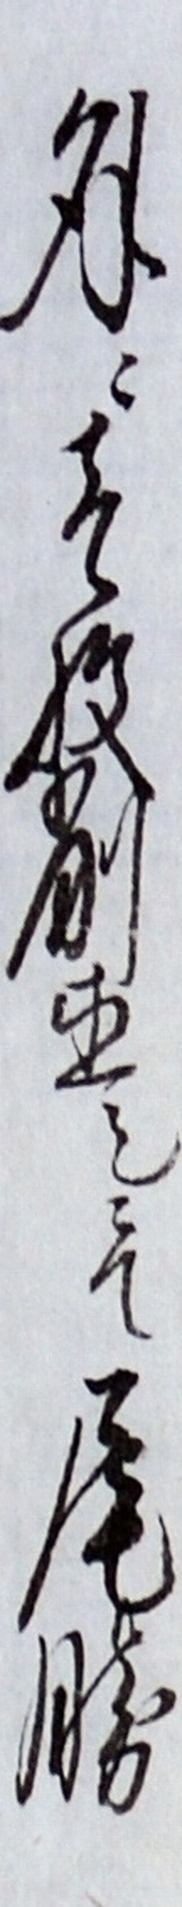外ニ壱枚削直しニて尾勝
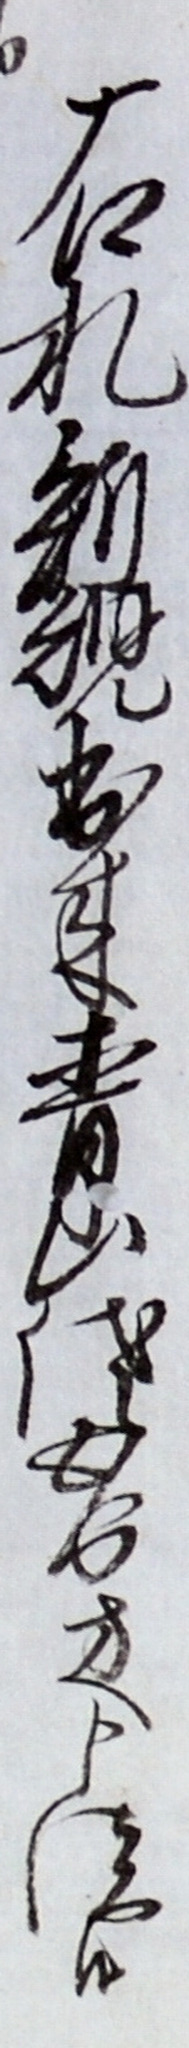右札新規出来青山佐五右衛門方へ申談候
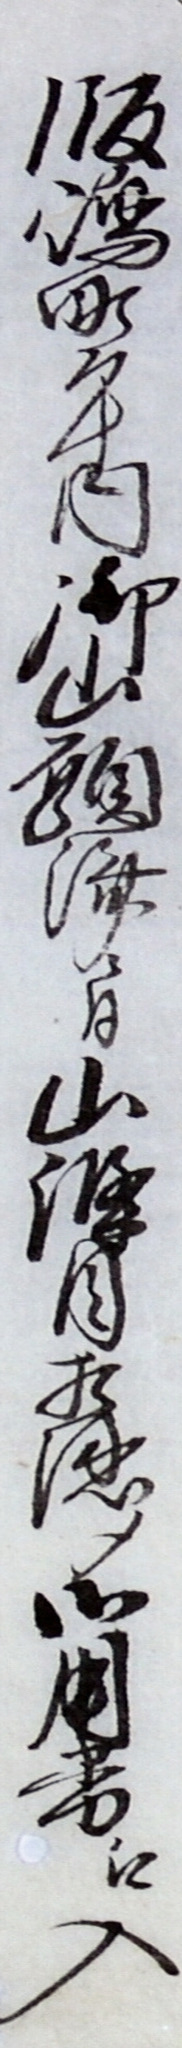一飯嶋町平内御山願済ニ付山條目相認メ御用番江入
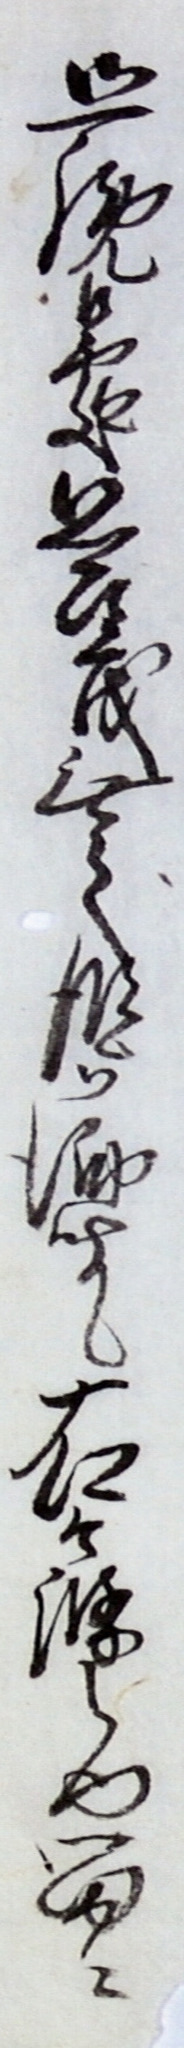御一覧候処思召も無之段被仰聞候右ケ條之内留ニ

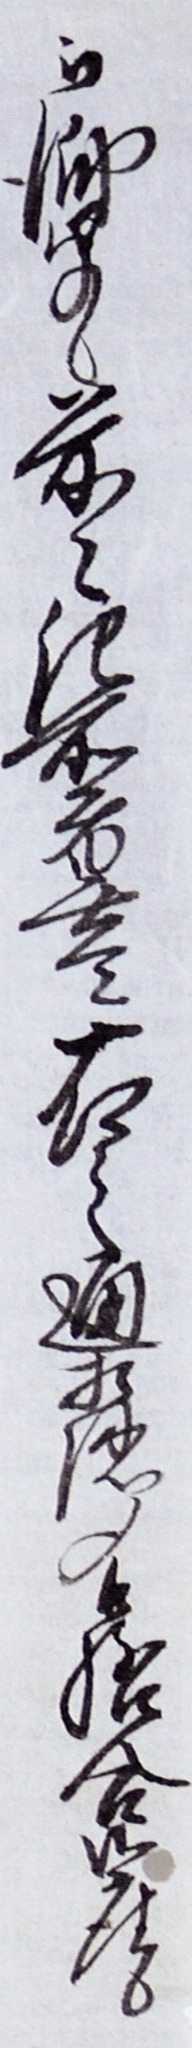被仰聞候前々他所者共ニ右之通相認メ候格合御座候
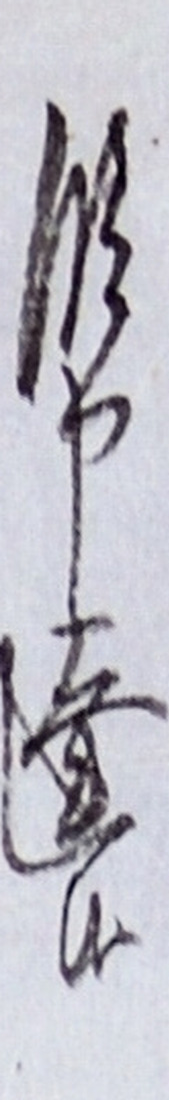段申達候
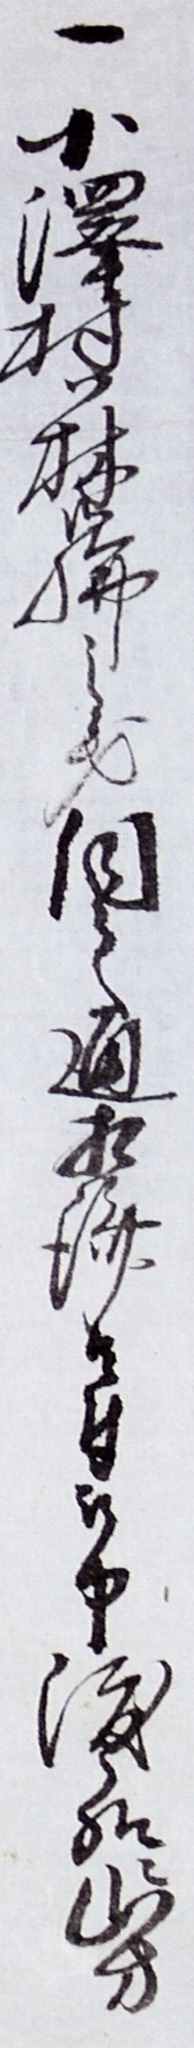一小澤村御林御払之義伺之通相済候付被申渡候様ニ山方
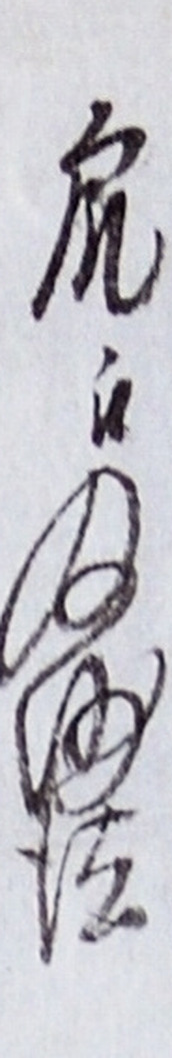衆江及沙汰
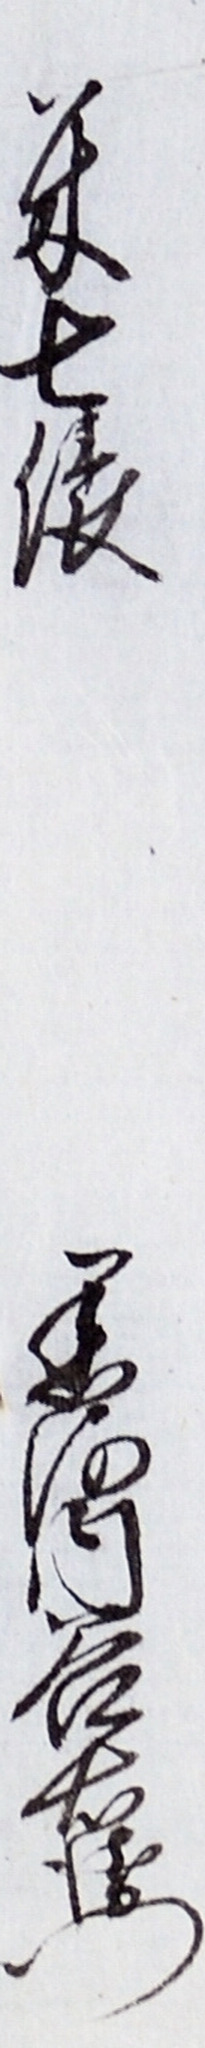米七俵黒河内善右衛門
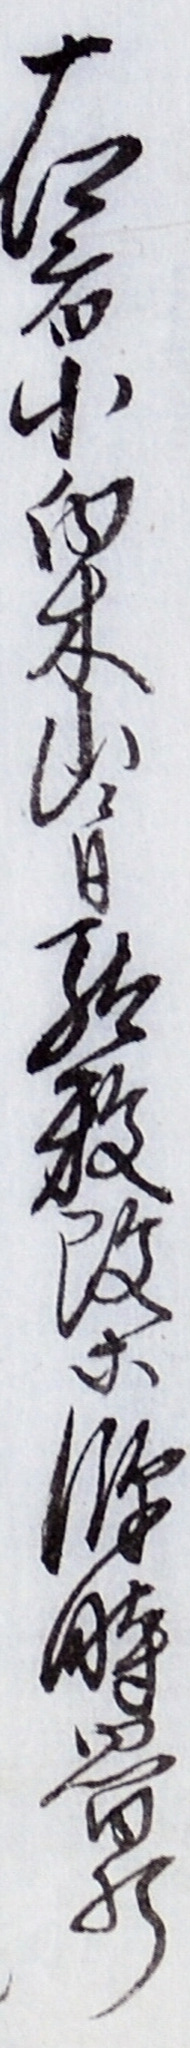右は小白木山ニ付駄数改等臨時骨折
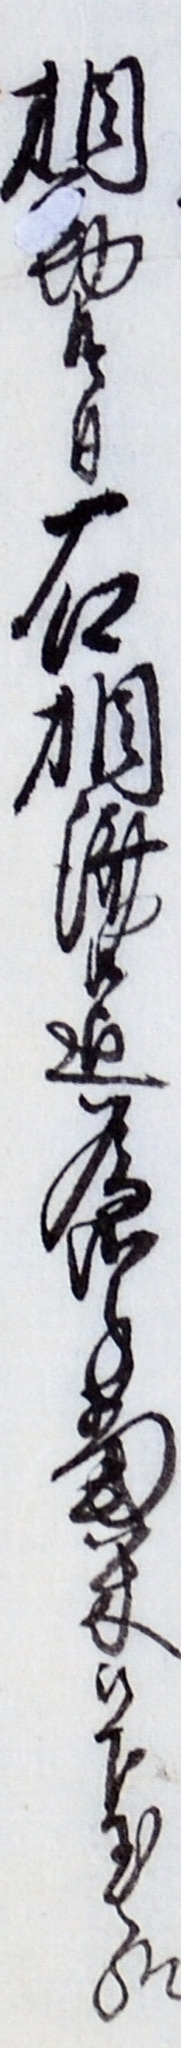相勤候ニ付右相済候迄為御手当米被下候様
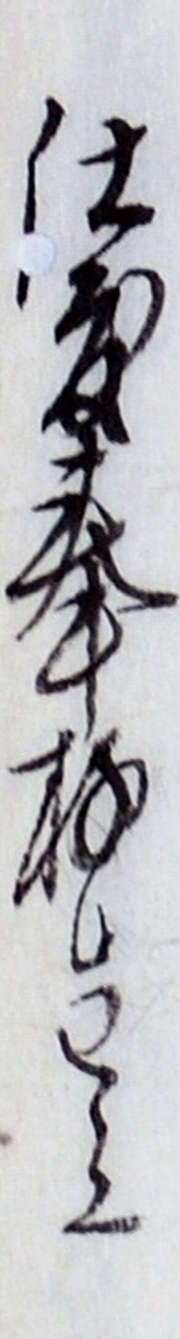仕度奉存候已上
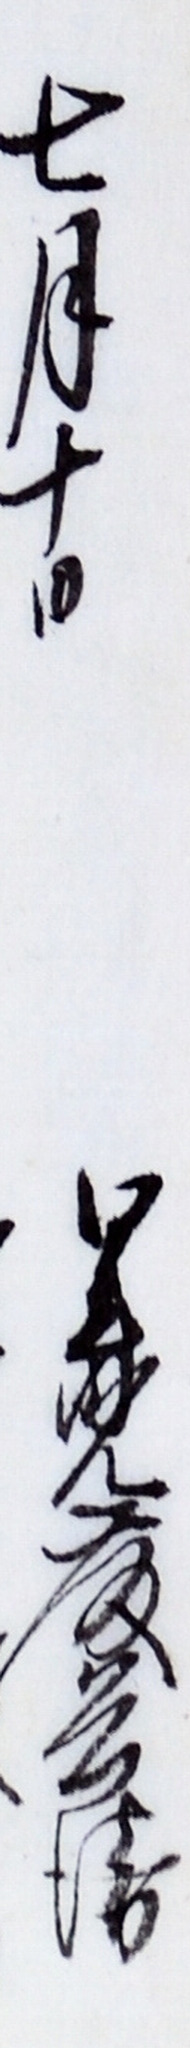七月十日里見藤兵衛
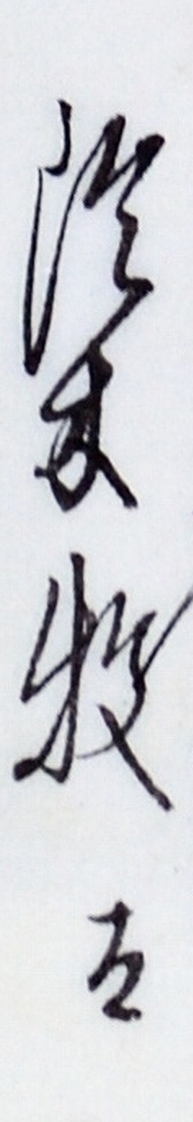鈴木牧太
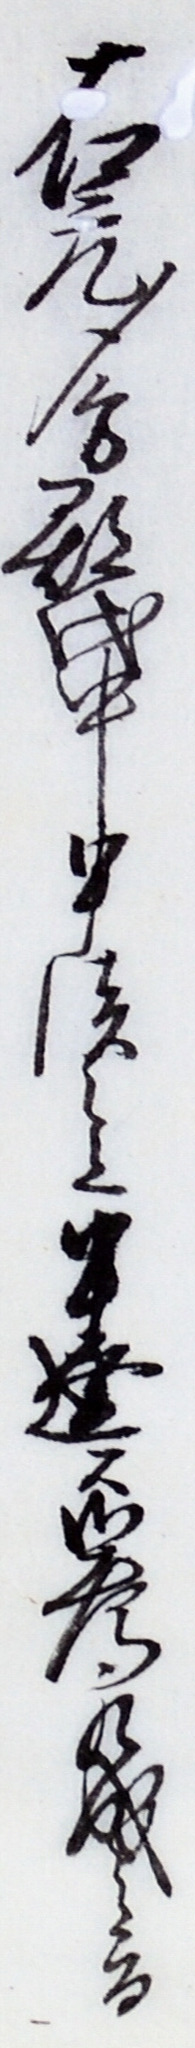右元〆方郡代申談之上申達ス御考被成之旨
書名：御山奉行御用控
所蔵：伊那市立高遠町図書館・合同会社AMANE
